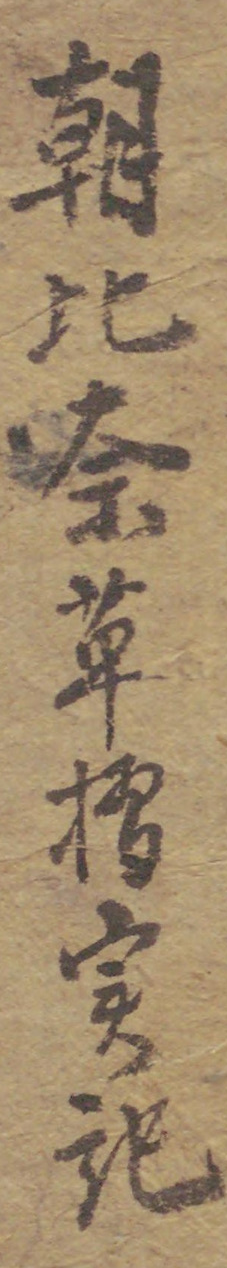朝比奈草摺実記

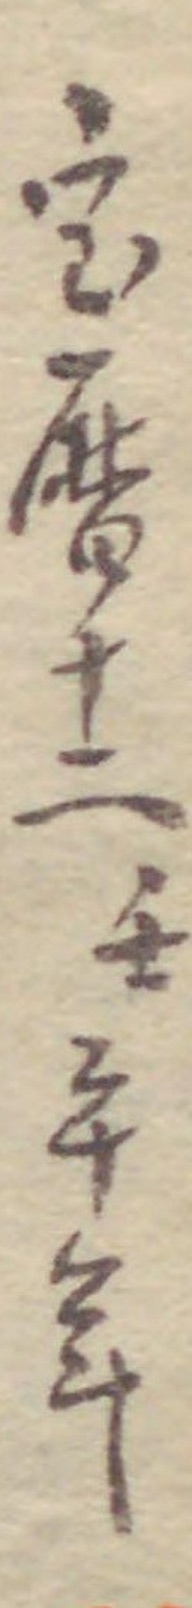宝暦十二壬午年
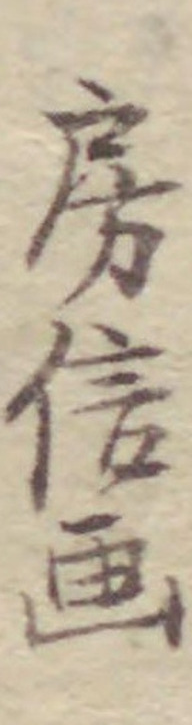房信画
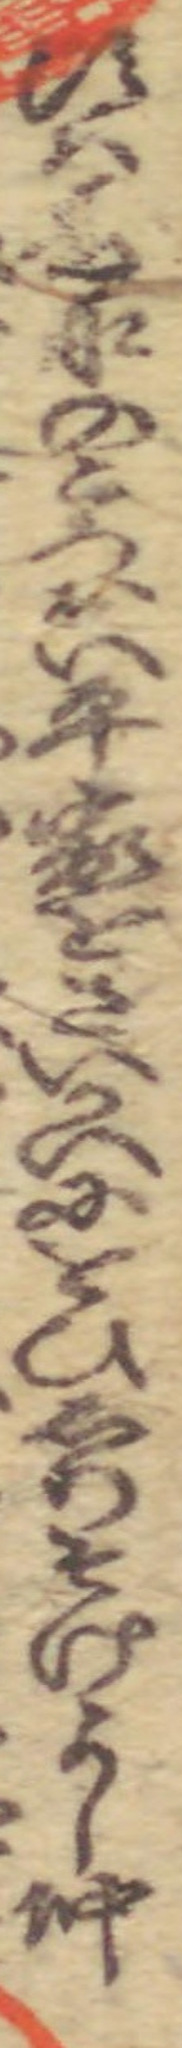頃は寿永のと？う？か？い？平家をさいかいにをひしりそけよし仲
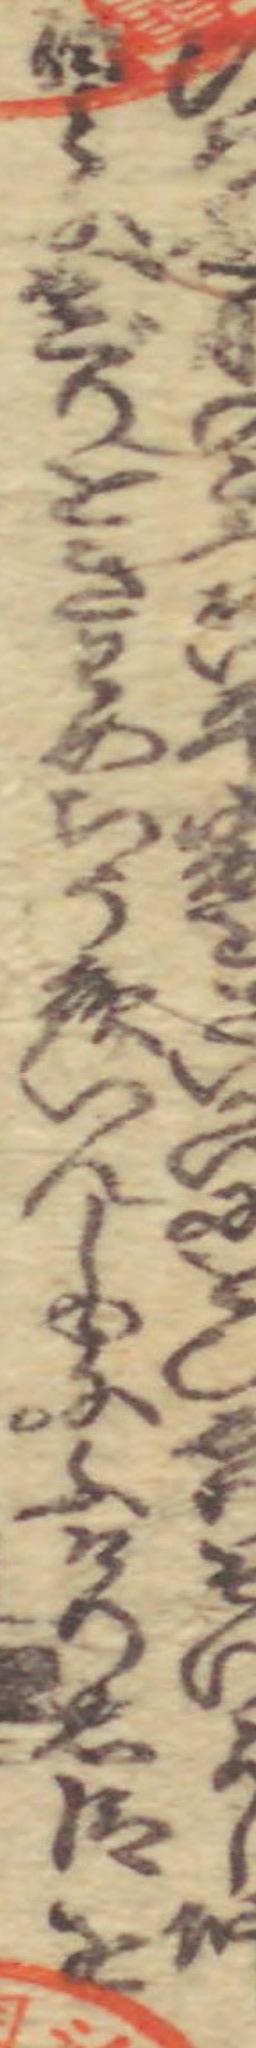ふぎりをきわめちう夜いんしゆにふけり忠臣を
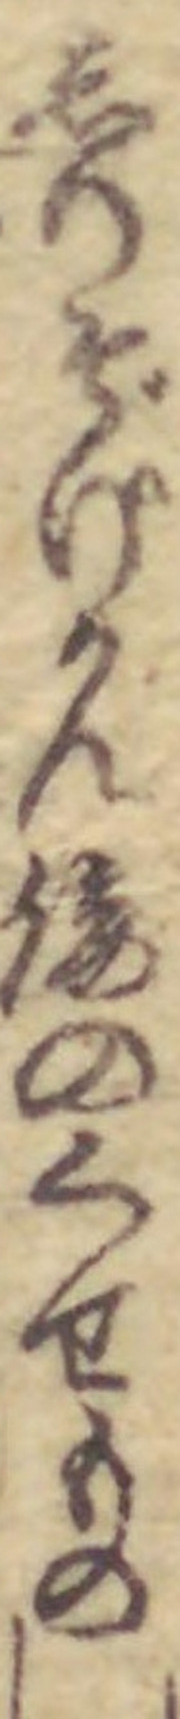しりぞけかん佞のくせもの
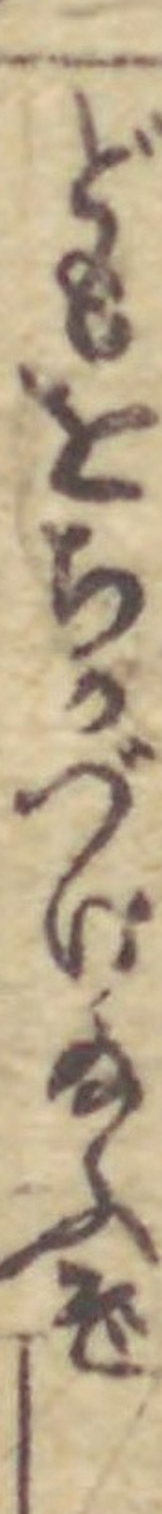どもをちかづけ給ふぞ
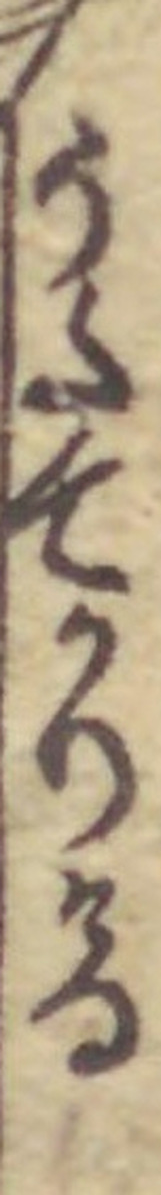うたてかりける
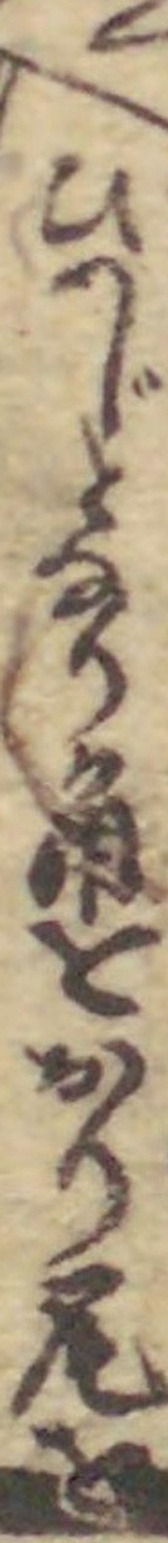ひつじとなり角をかり尾を
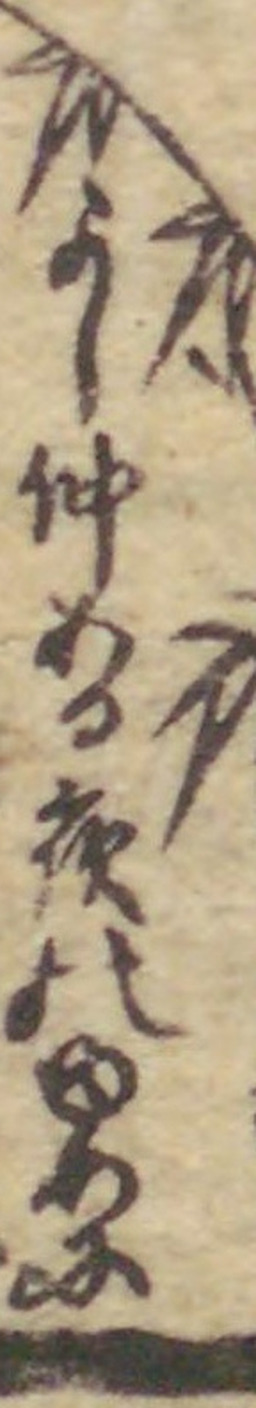よし仲ある夜のゆめに
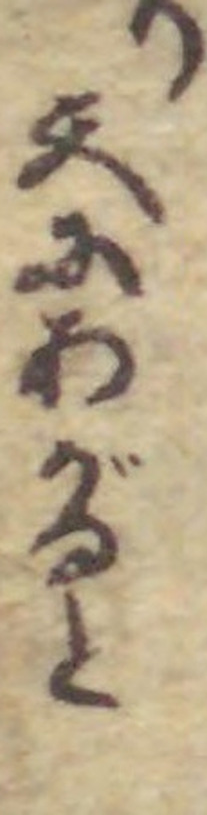天にあがると

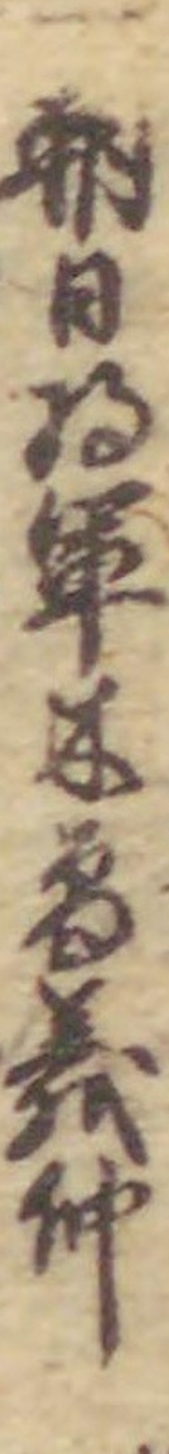朝日将軍木曽義仲
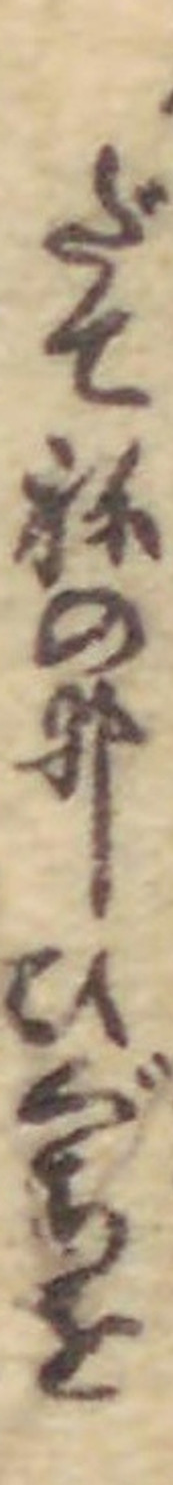だてねのいひぐちを
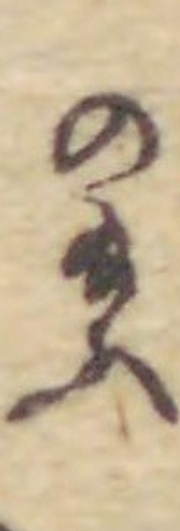の給ふ
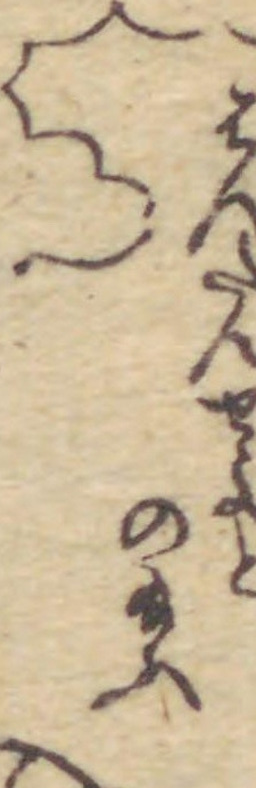の給ふ
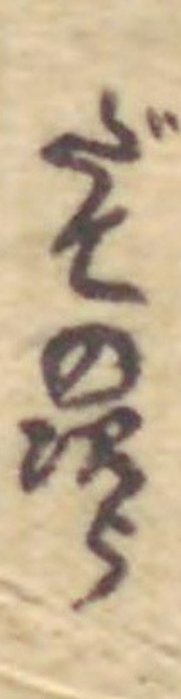だての次郎
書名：朝比奈草摺実記 2巻
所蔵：国立国会図書館 National Diet Library, JAPAN
